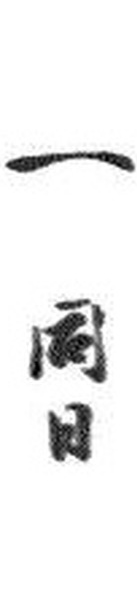一同日
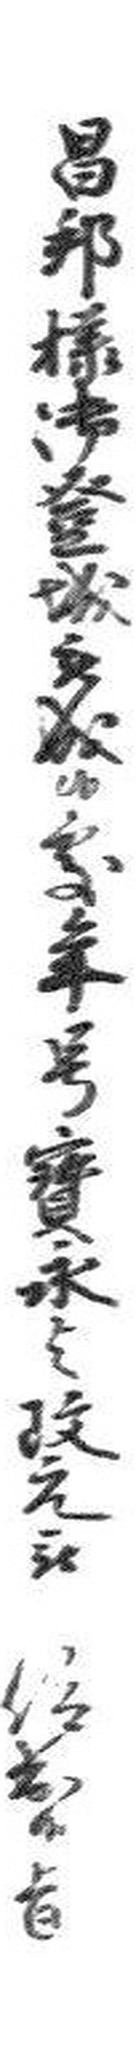昌邦様御登城被成候処年号宝永与改元被仰出候旨
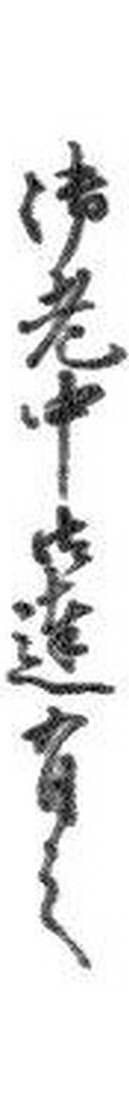御老中御達有之

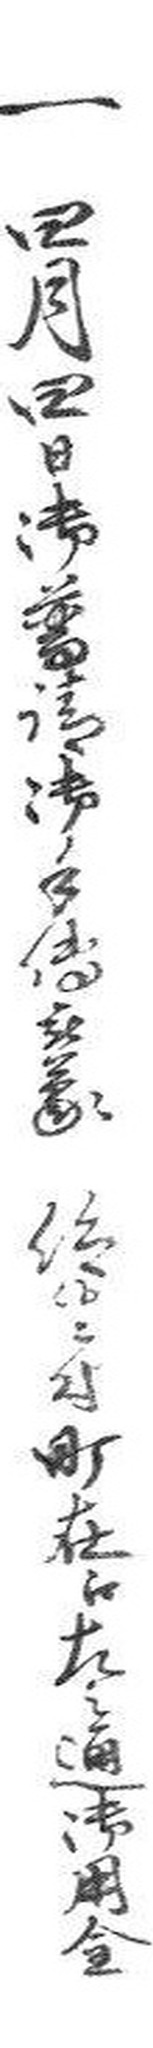一四月四日御普請御手伝被蒙仰候ニ付町在江左之通御用金
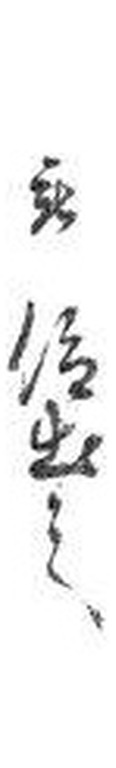被仰出之
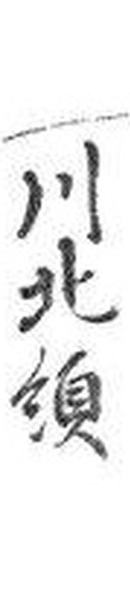川北領
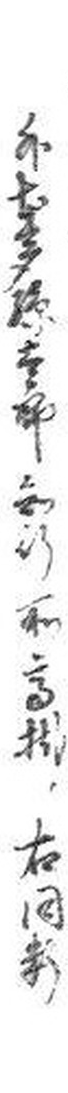外本多孫太郎知行所高掛り右同断
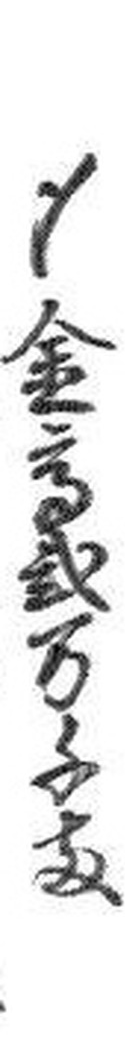〆金高弐万千両
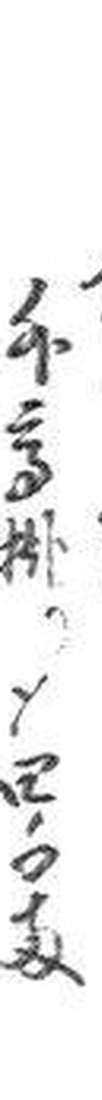外高掛り〆四千両
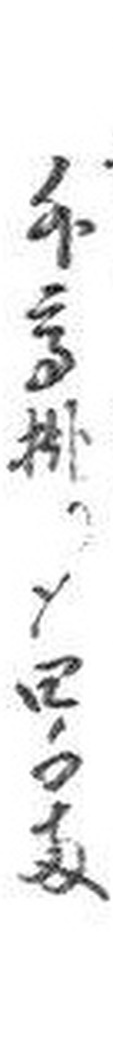外高掛り〆四千両
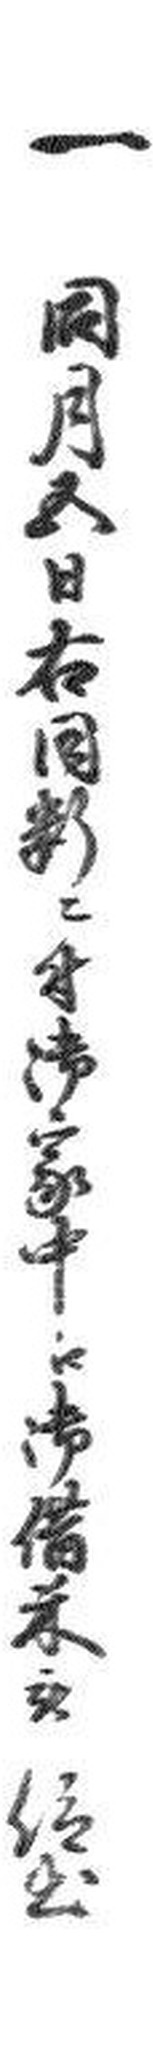一同月五日右同断ニ付御家中江御借米被仰出
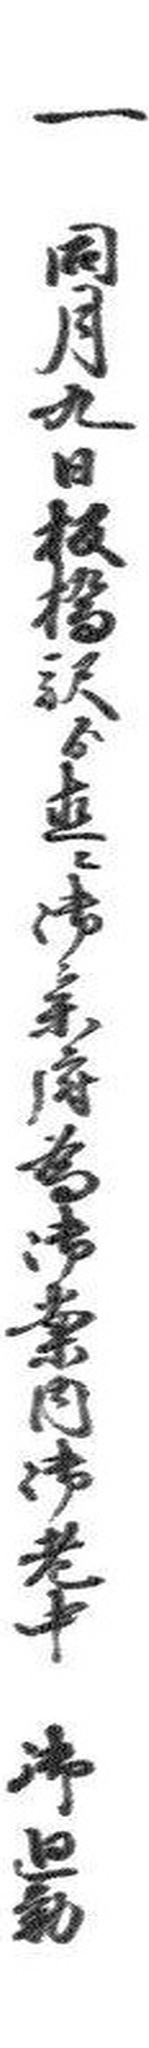一同月九日板橋駅ゟ直ニ御参府為御案内御老中御廻勤
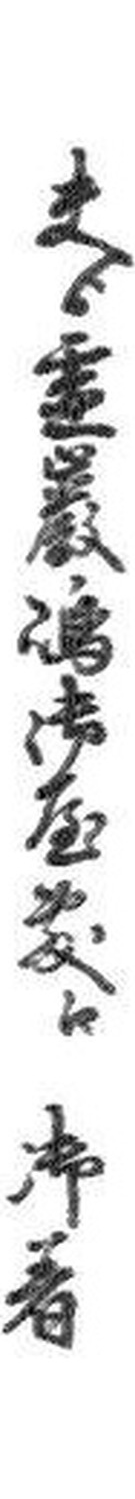夫ゟ霊厳嶋御屋敷江御着
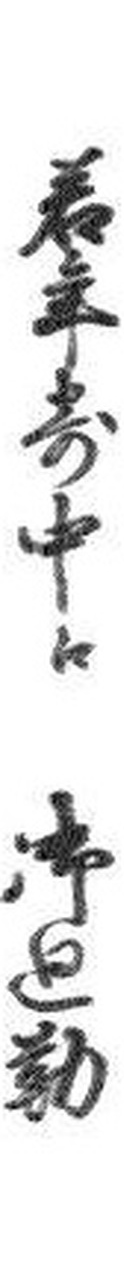若年寄中江御廻勤
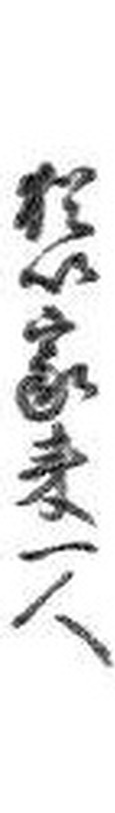猶以家来一人
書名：家譜 二十三 吉品公 従宝永元年到同二年
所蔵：福井県文書館 Fukui Prefectural Archives
